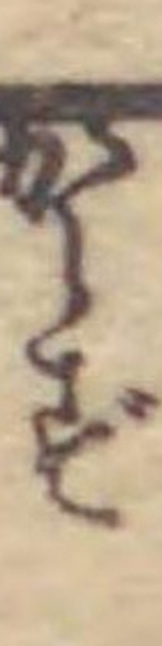からず
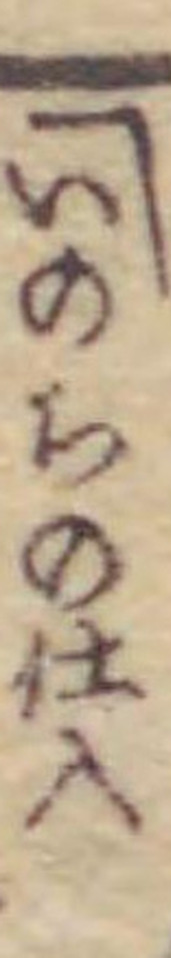〽いのちの仕入
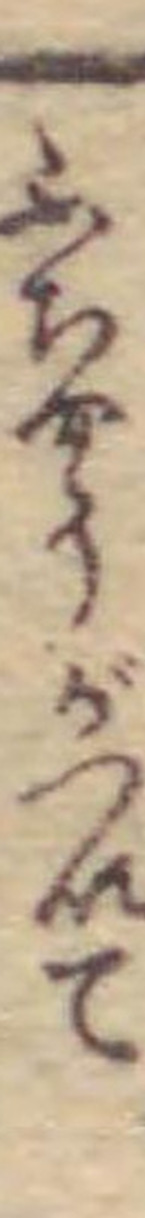ふちやうがついて
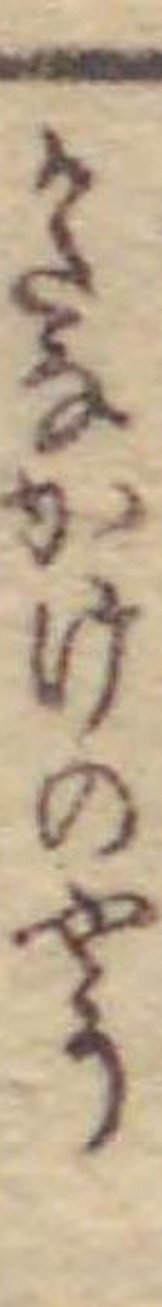かたなかけのやう
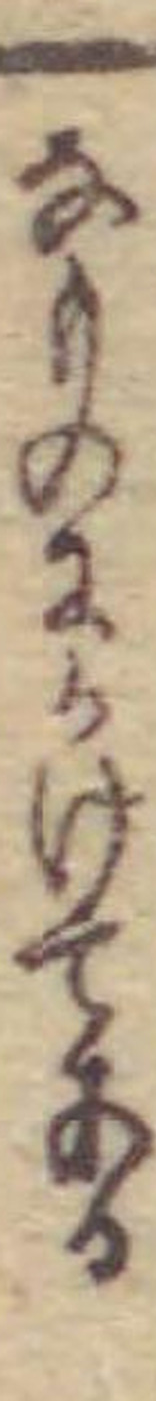なものにかけてある

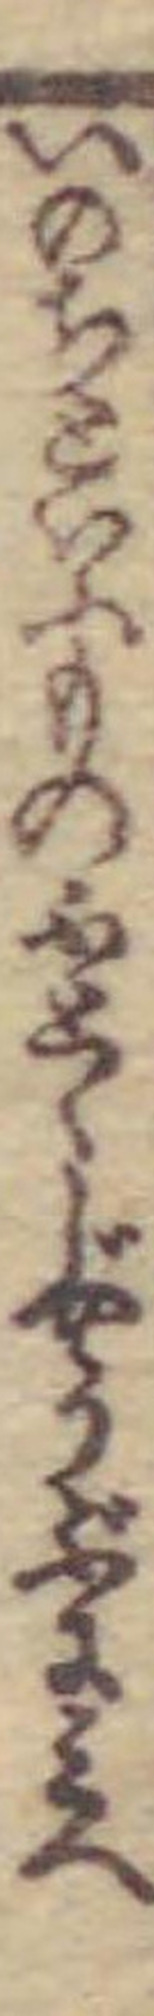いのちといふものふとくじやうぶにみへ
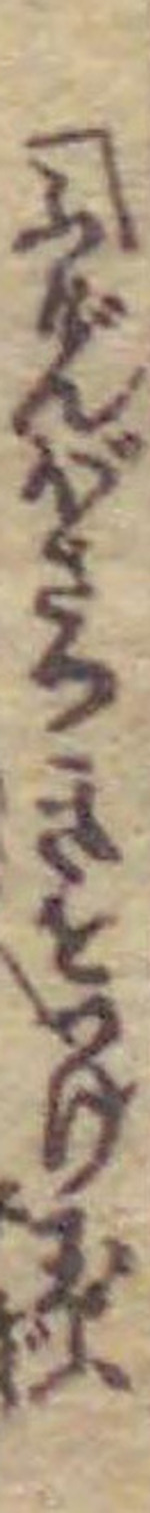〽ふげんぼさつきをつけ玉ふ
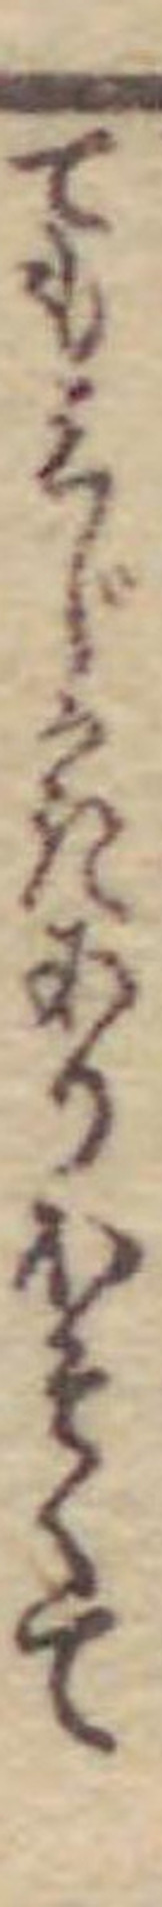てもみじかきありほそくて
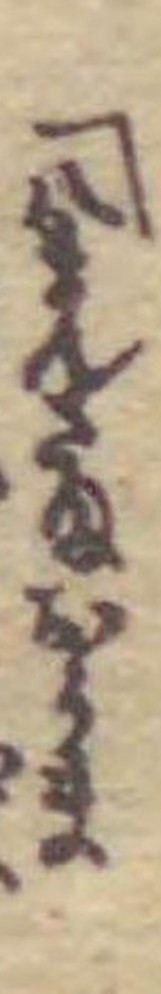〽八まんさまおうま
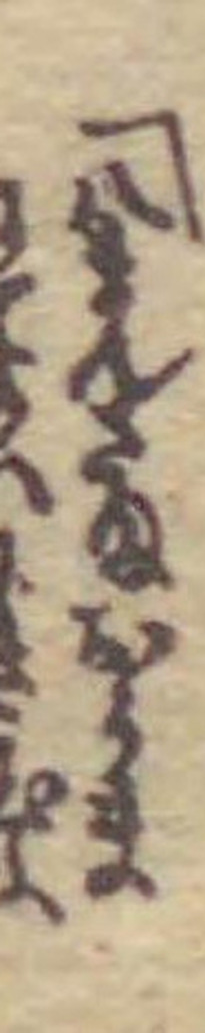〽八まんさまおうま
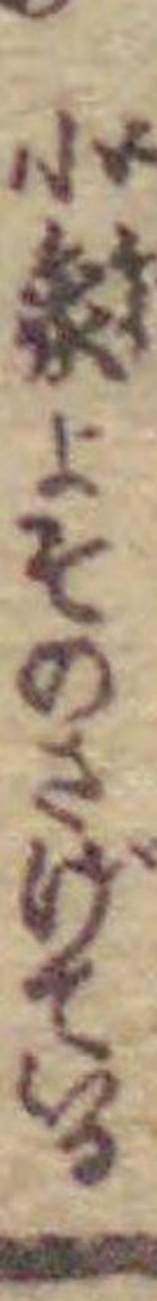小象よそのさげている
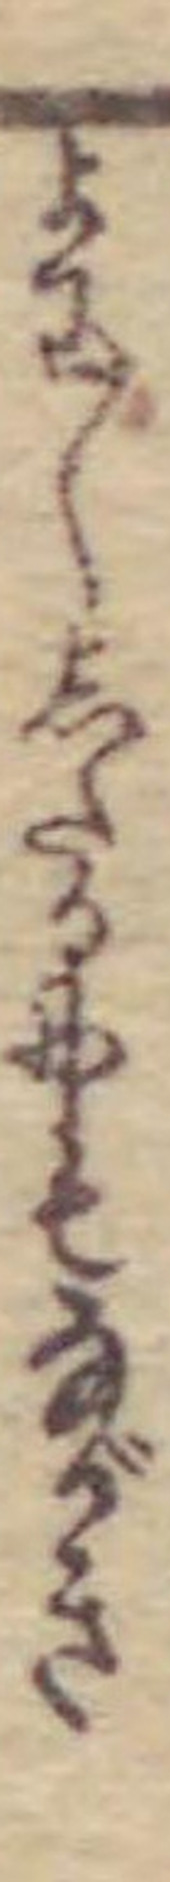よわ〳〵したるにもながき
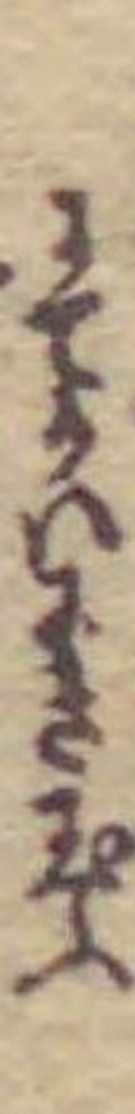にてかいにき玉ふ
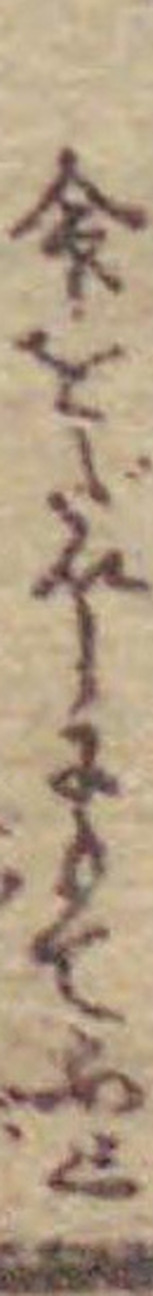命をだいしにもてふと
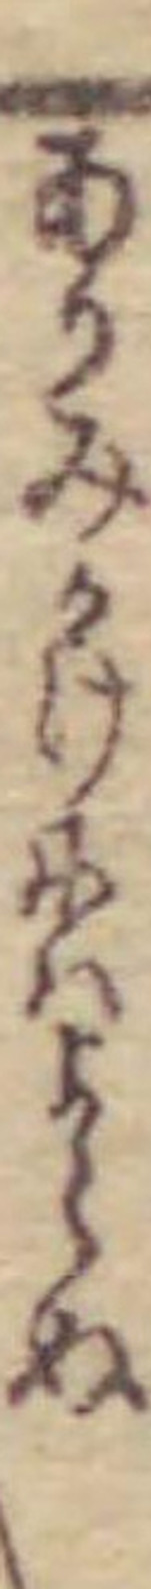ありみかけにはよらぬ
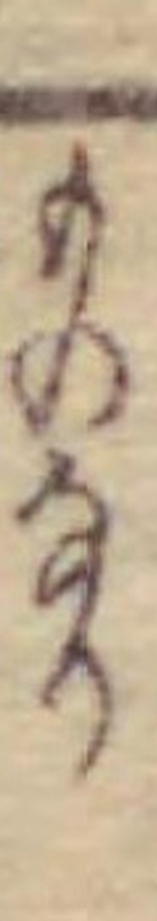ものなり
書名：御誂染長寿小紋 : 3巻
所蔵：国立国会図書館 National Diet Library, JAPAN
